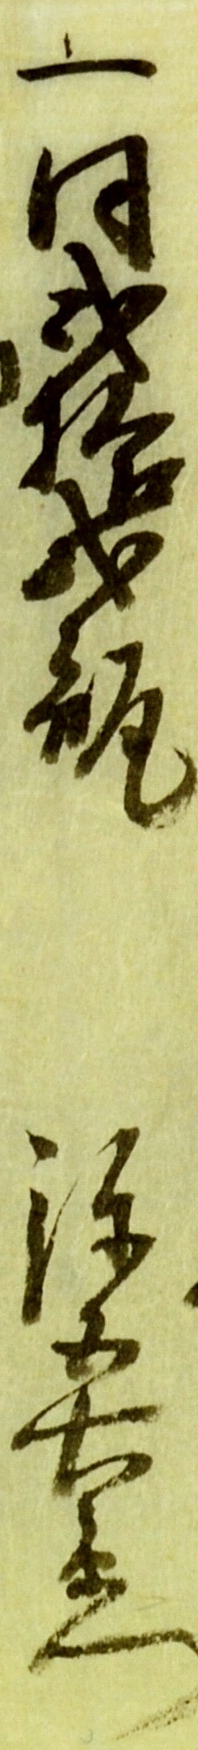一同弐拾弐瓶弥五右衛門
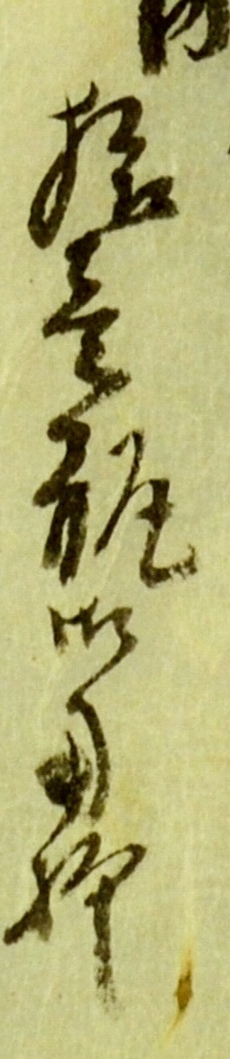内拾壱瓶御用捨

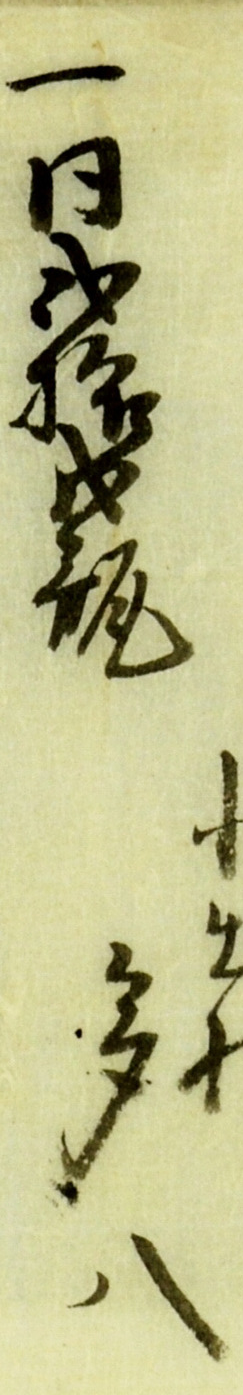一同弐拾弐瓶多八
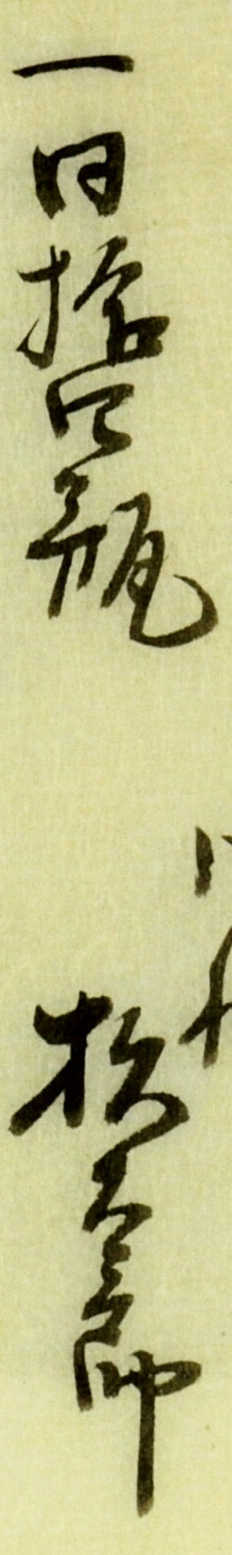一同拾四瓶杉太郎
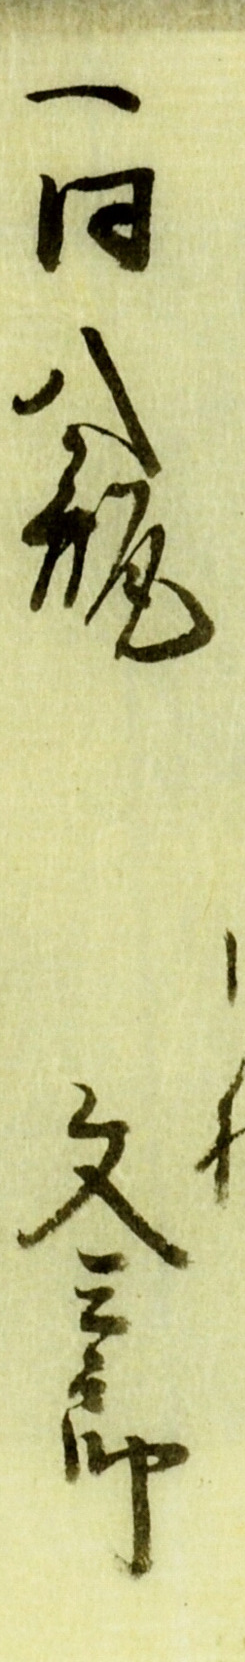一同八瓶文三郎
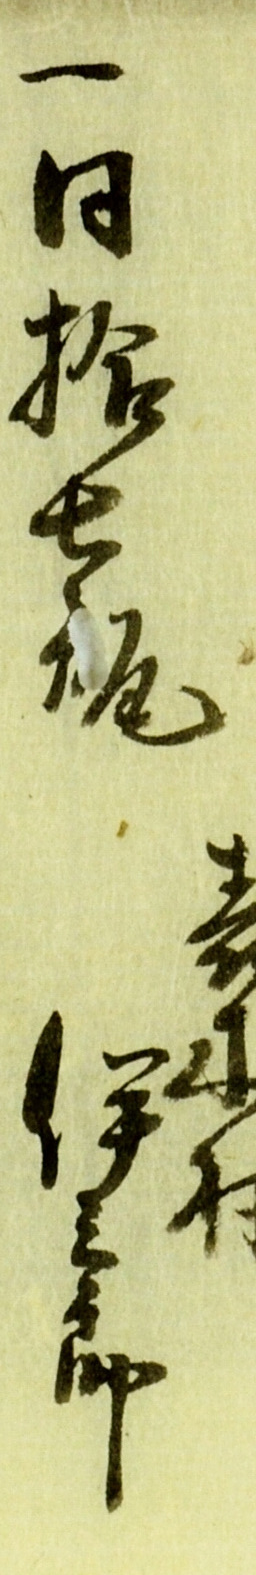一同拾七瓶伊三郎
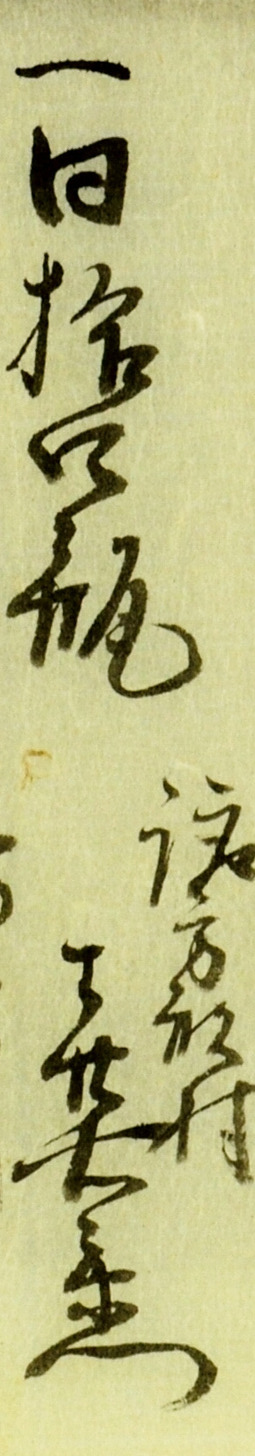一同拾四瓶喜右衛門
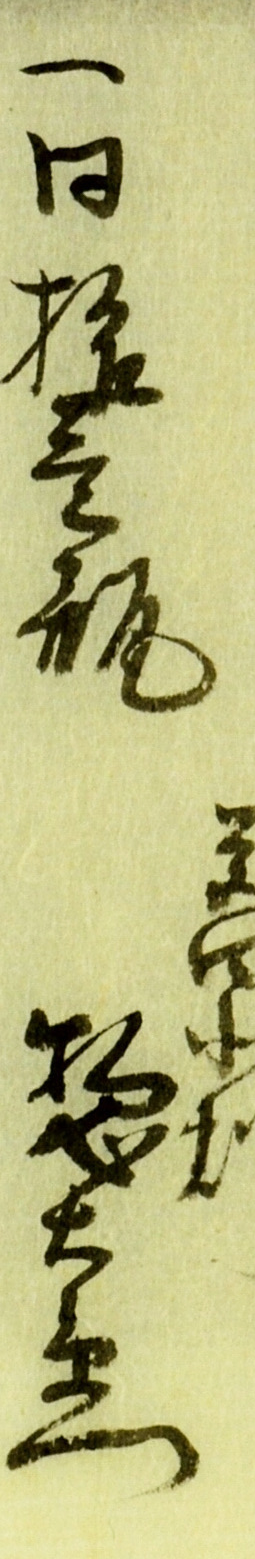一同拾壱瓶惣右衛門
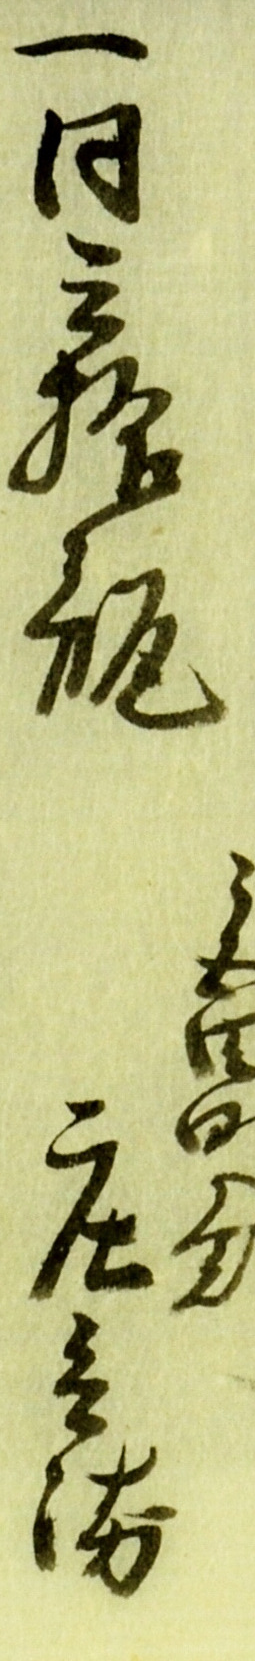一同三拾瓶庄兵衛
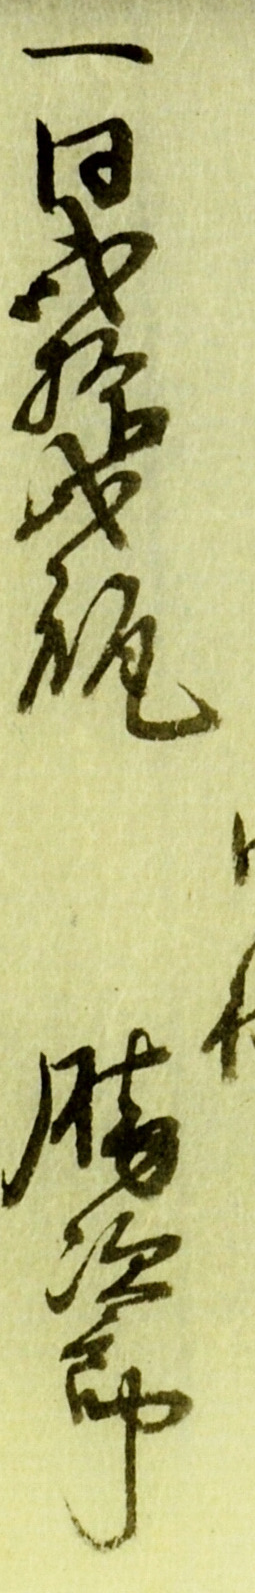一同弐拾弐瓶勝治郎
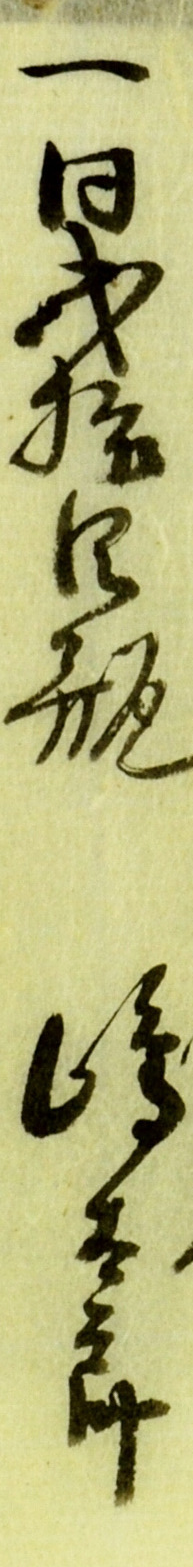一同弐拾四瓶島太郎
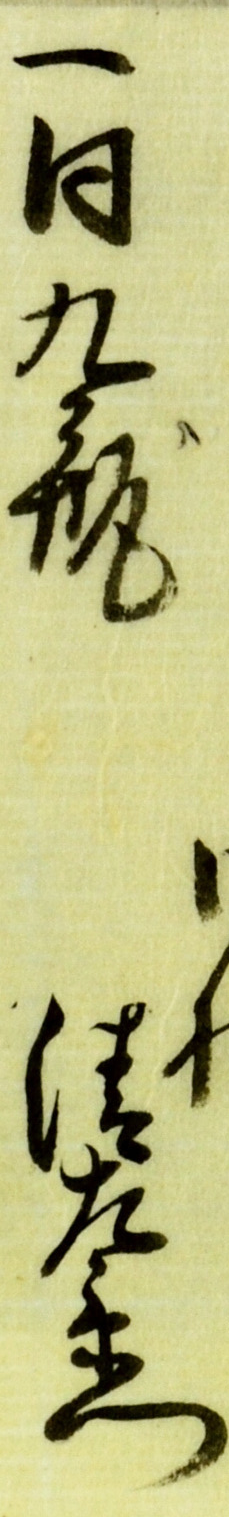一同九瓶清左衛門
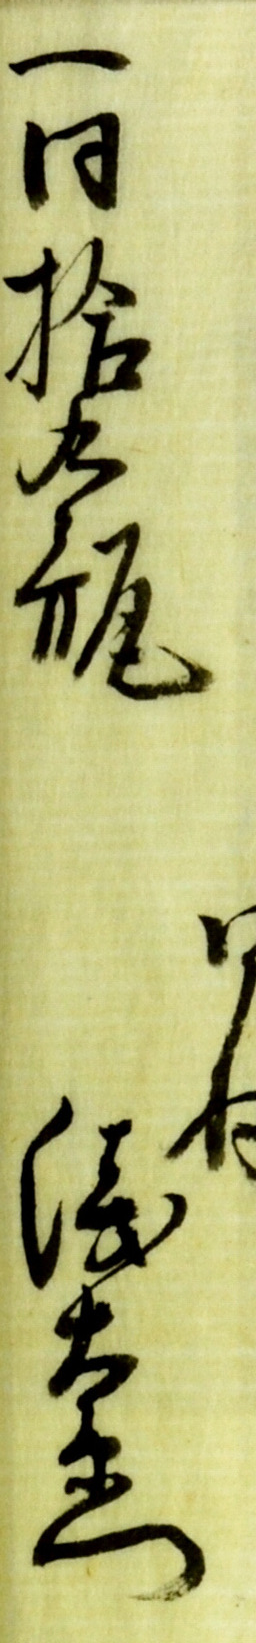一同拾九瓶儀右衛門

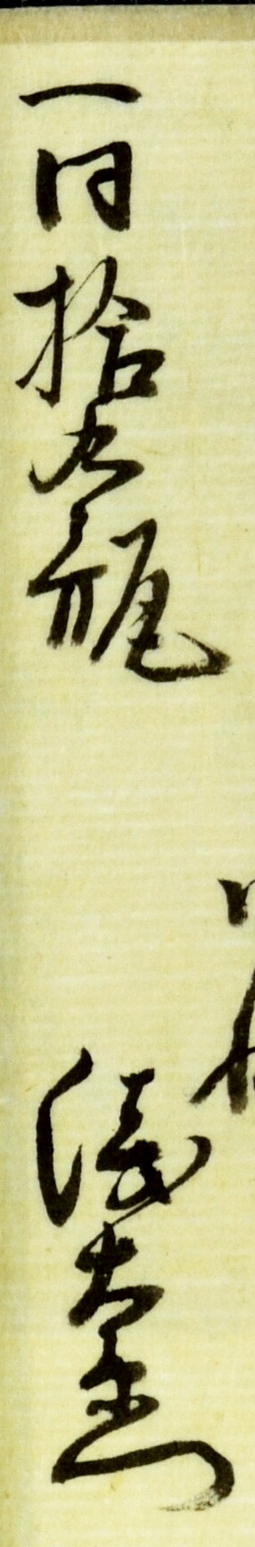一同拾五瓶治郎右衛門
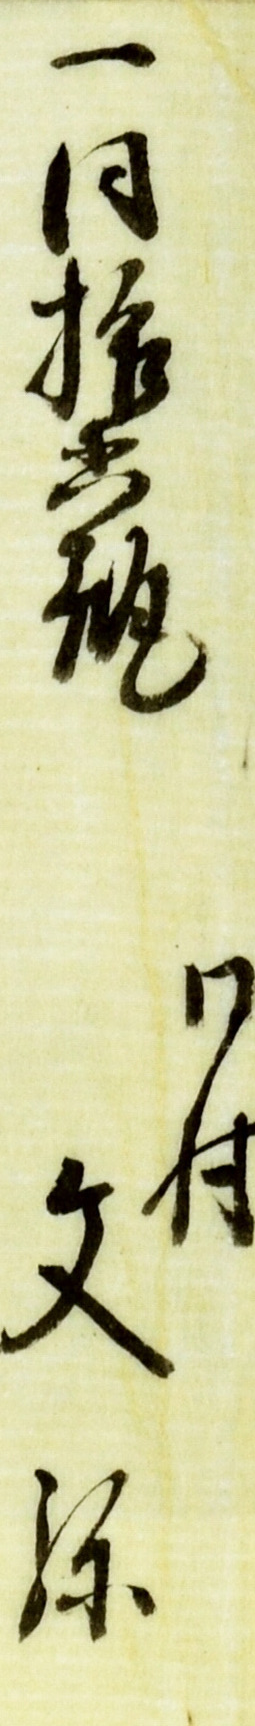一同拾六瓶文弥
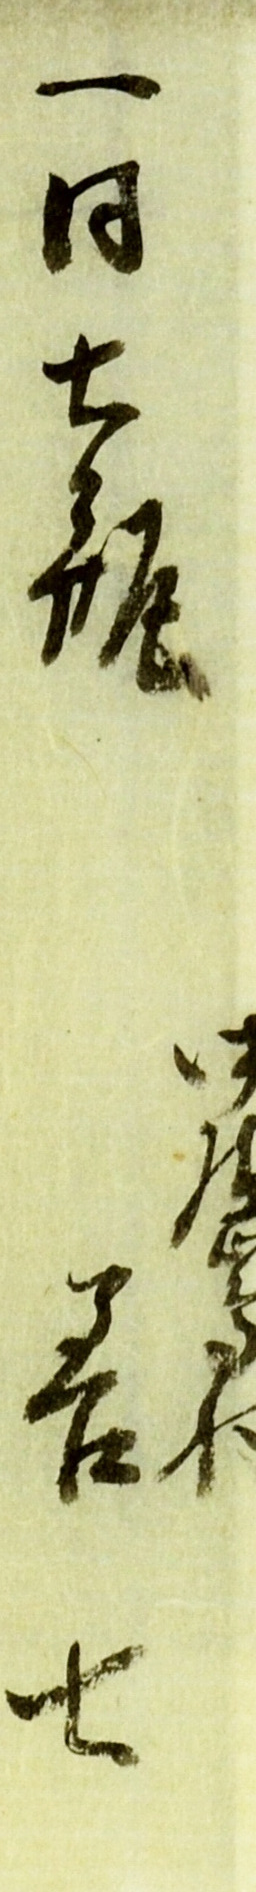一同七瓶善七
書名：御領分中御領分中紺屋藍瓶員数御改帳
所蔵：伊那市立高遠町図書館・合同会社AMANE
